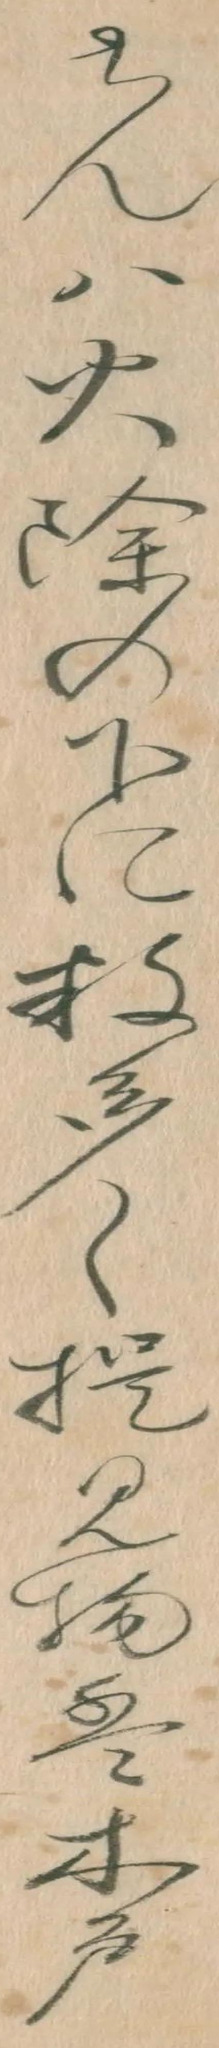ちんは火除の下に数多く提見物は木戸
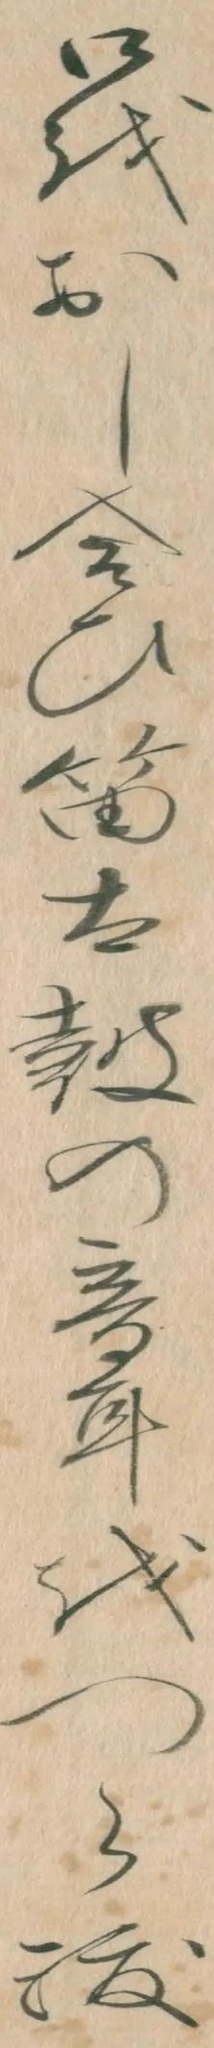口をおし合い笛太鼓の音耳をつら抜
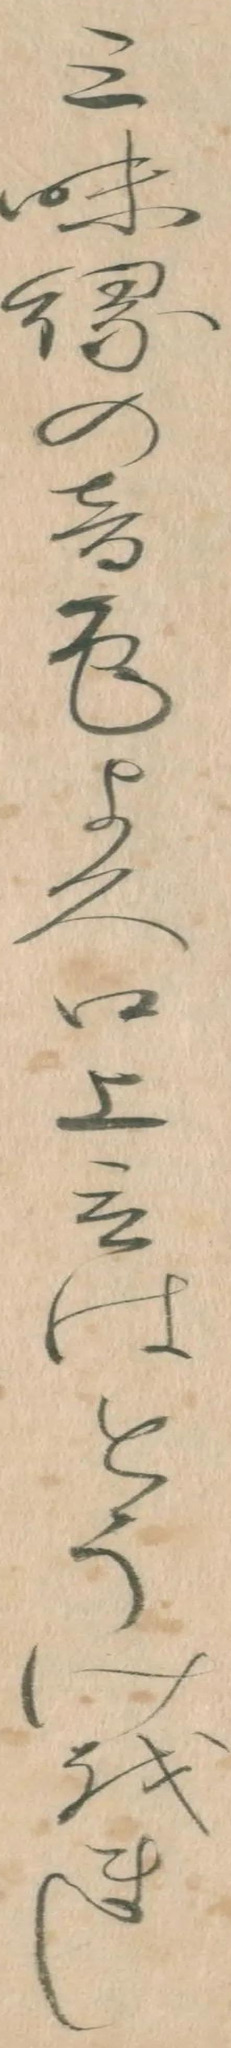三味線の音色よく口上立はとうけをまし
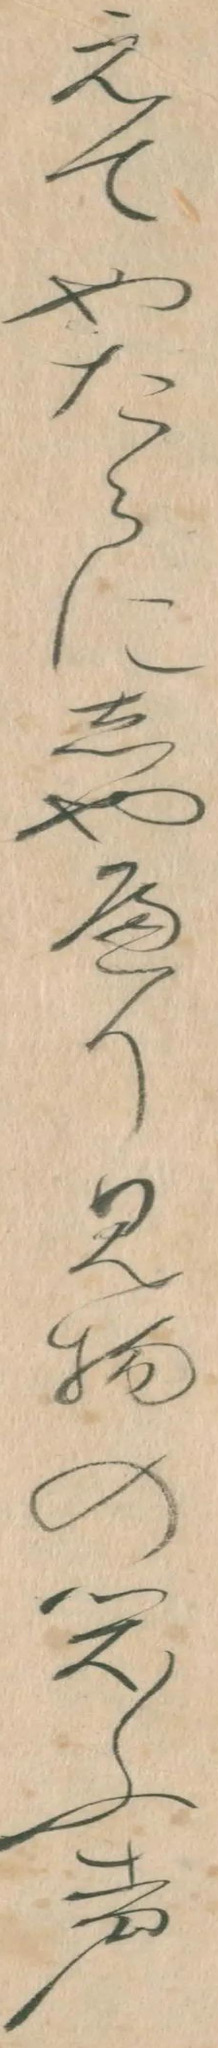えてやたらにしやへり見物の笑ふ声
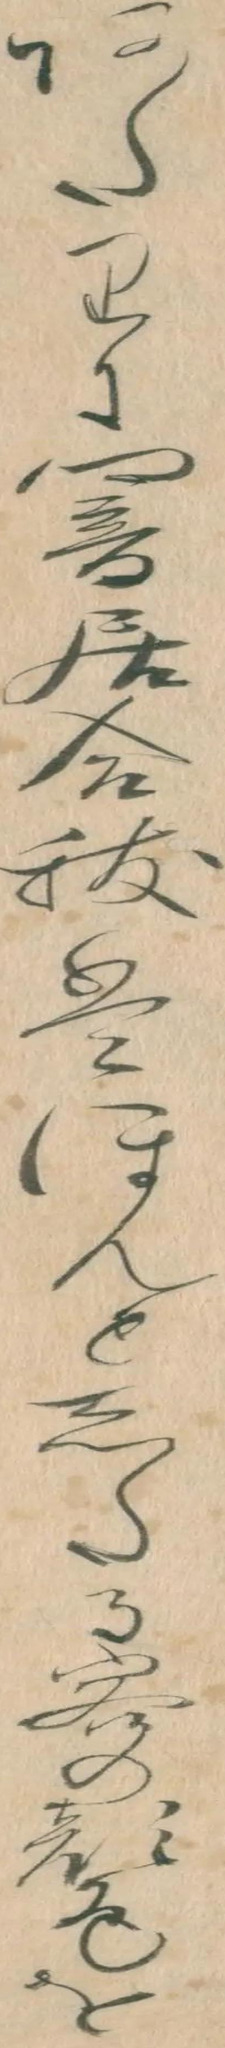あたりに響居合抜はほんとしたる客の顔色を

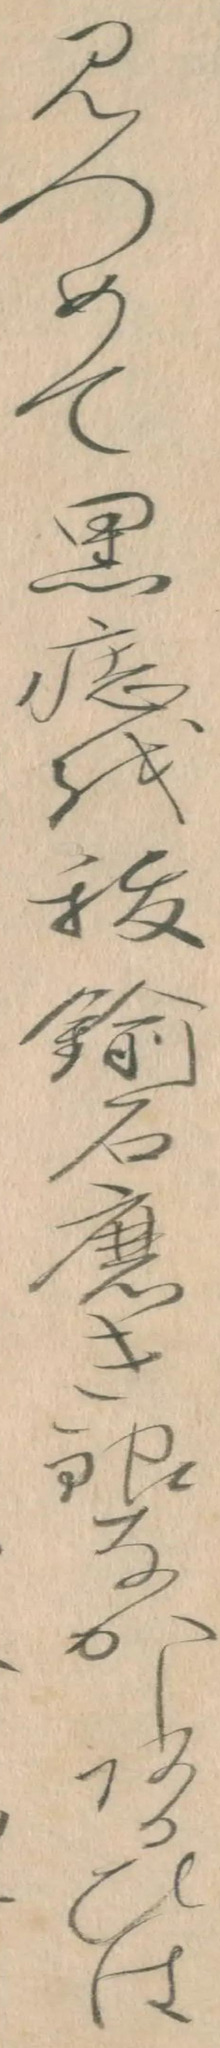見つめて黒痣を抜鍮石磨き銀なかしあるひは
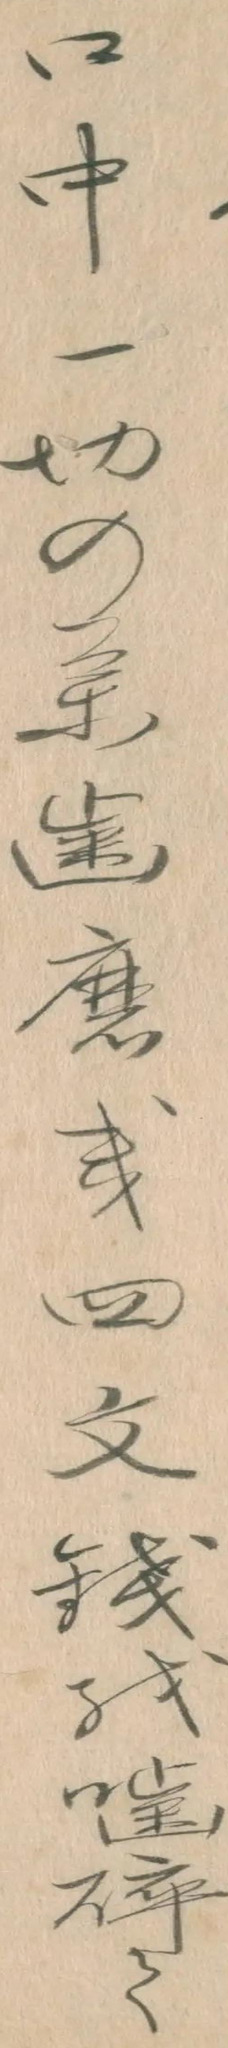口中一切の薬歯磨き四文銭を噛碎て
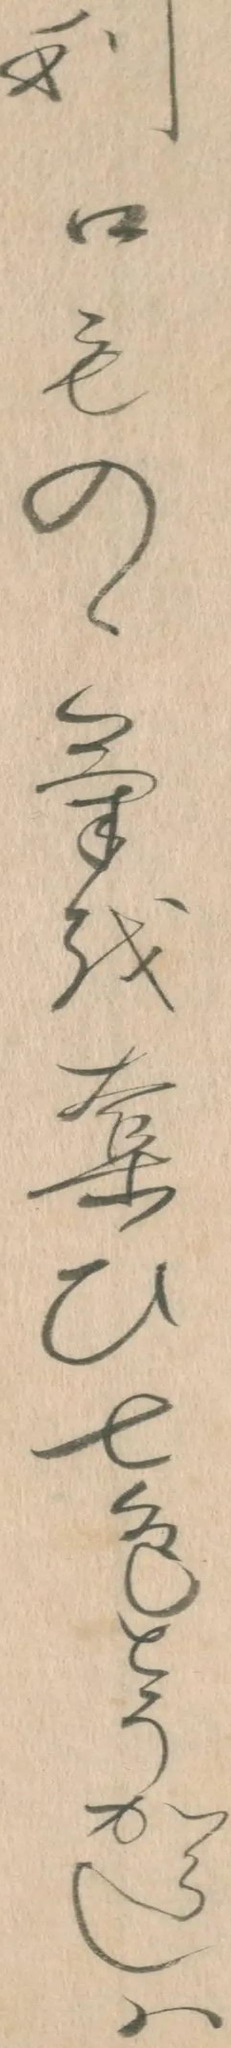利口ものゝ氣を奪ひ七色とうからしは
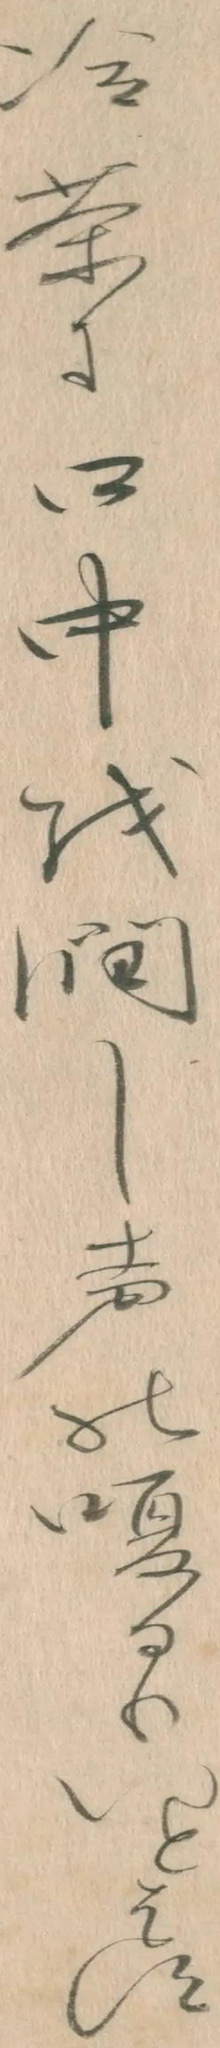冷茶に口中を潤し声の嗄るもいとはす
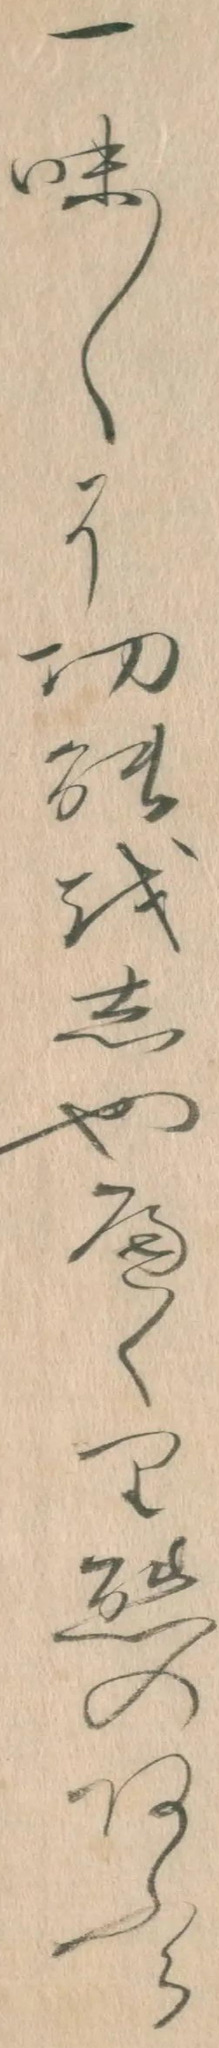一味〳〵に功能をしやへくり熊のあふら
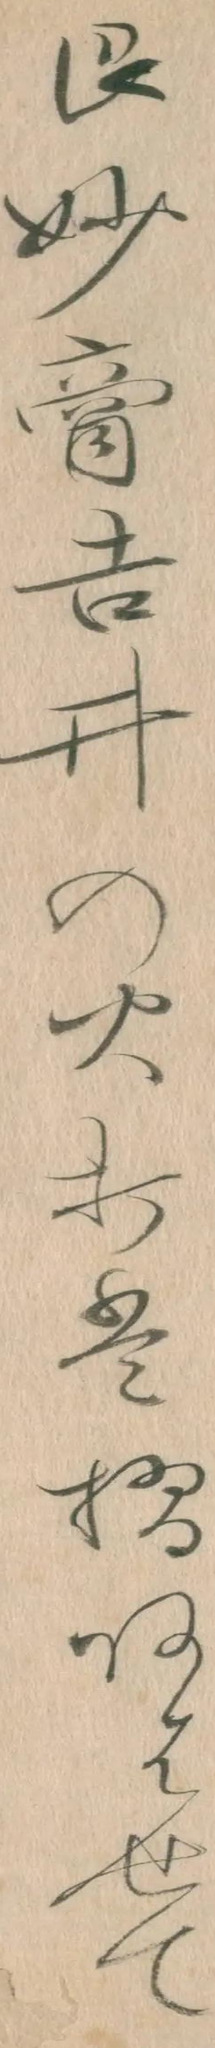即妙膏吉井の火打は摺あはせて
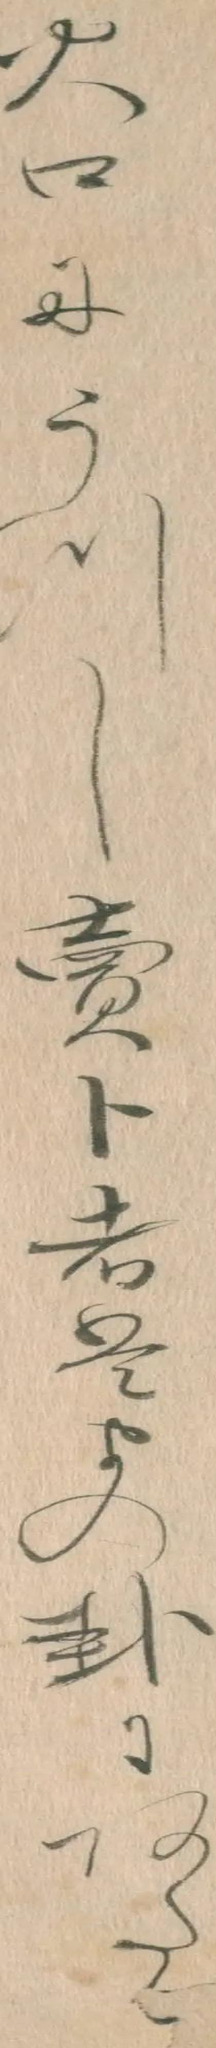火口にうつし賣ト者はまの卦にあた
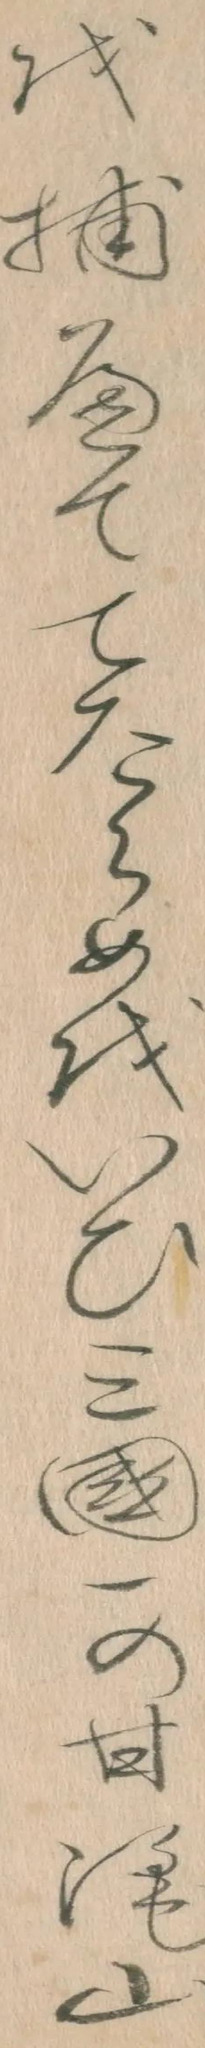を捕へててたらめをいひ三國一の甘酒山
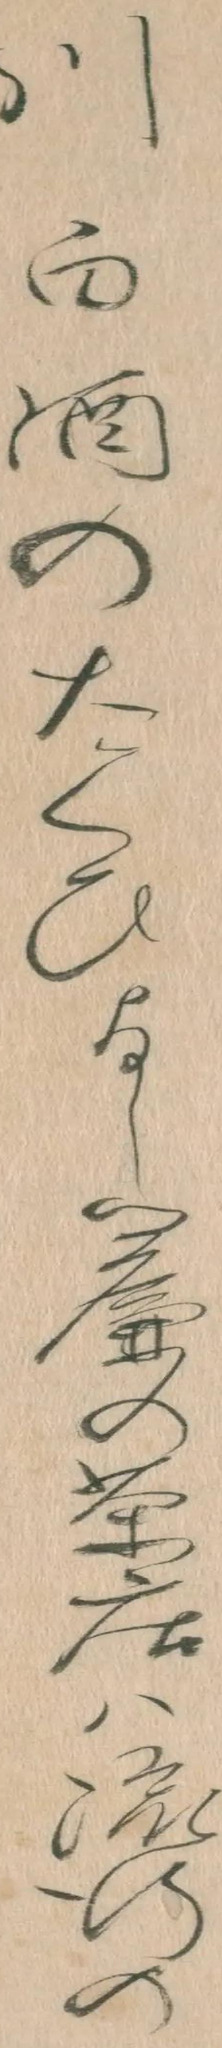川白酒のたくひなし簾の茶店は流行の
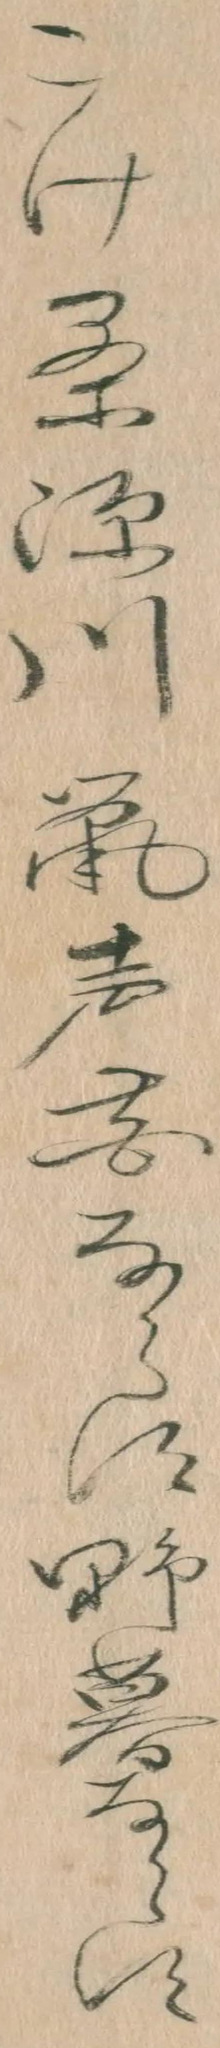こけ茶深川鼠声花ならす野暮ならす
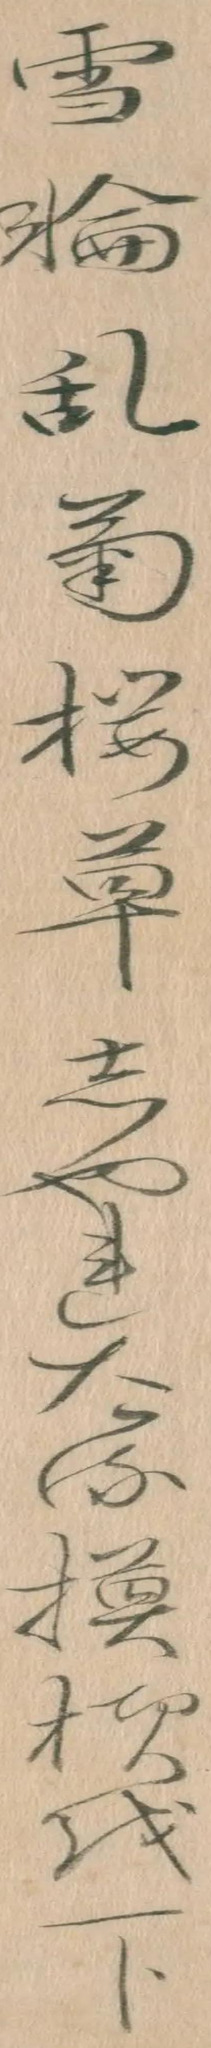雪輪乱菊桜草しやれたる模様を一ト
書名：俗語之種. [2]
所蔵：国立国会図書館 National Diet Library, JAPAN
